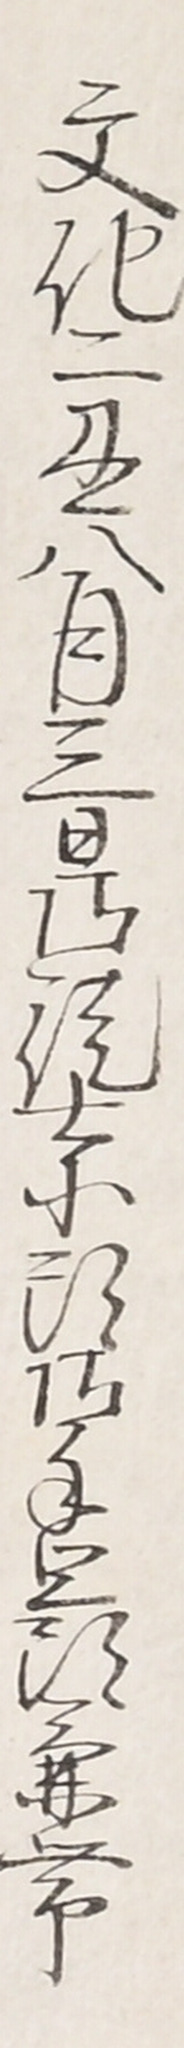一文化二丑八月三日御徒士小頭御手廻頭兼帯
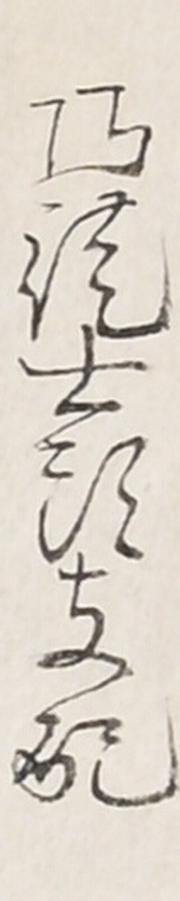御徒士頭支配
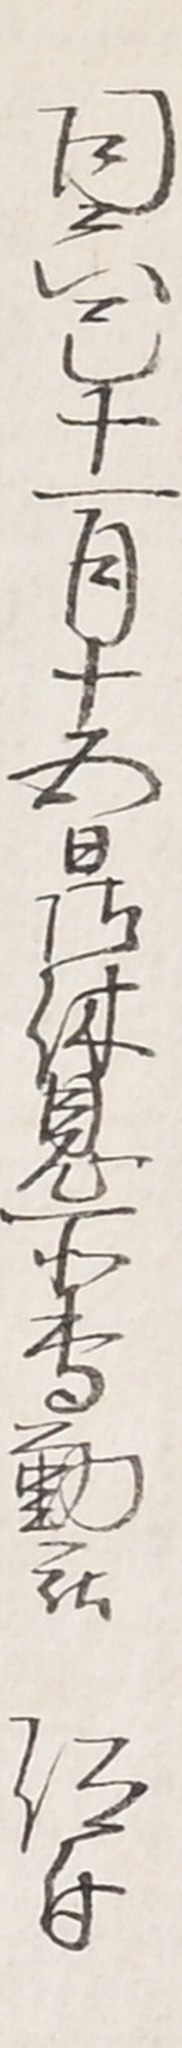一同六巳十一月十五日御休息所専勤被仰付
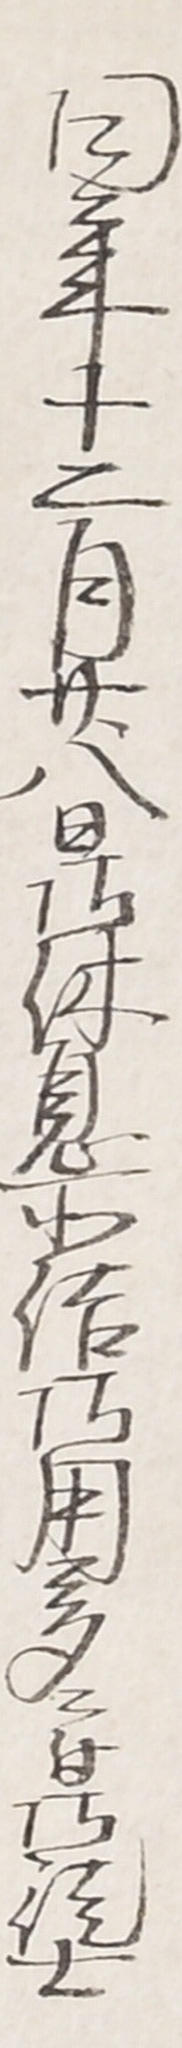一同年十二月廿八日御休息所詰御用多ニ付御徒士
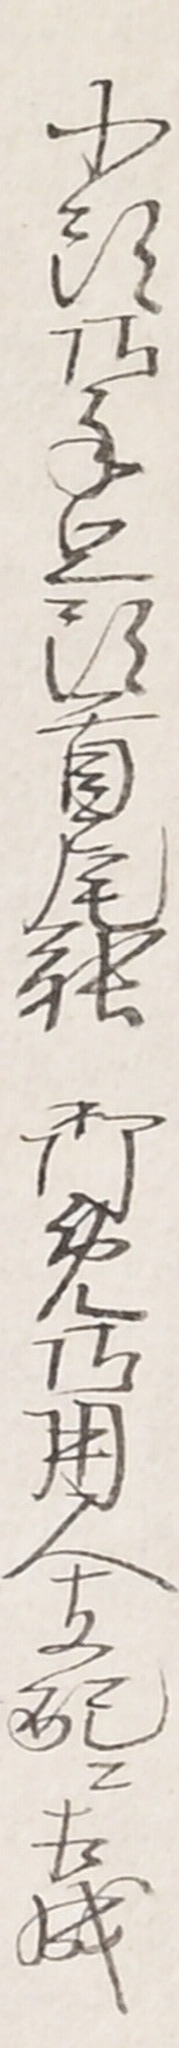小頭御手廻頭首尾能御免御用人支配ニ相成
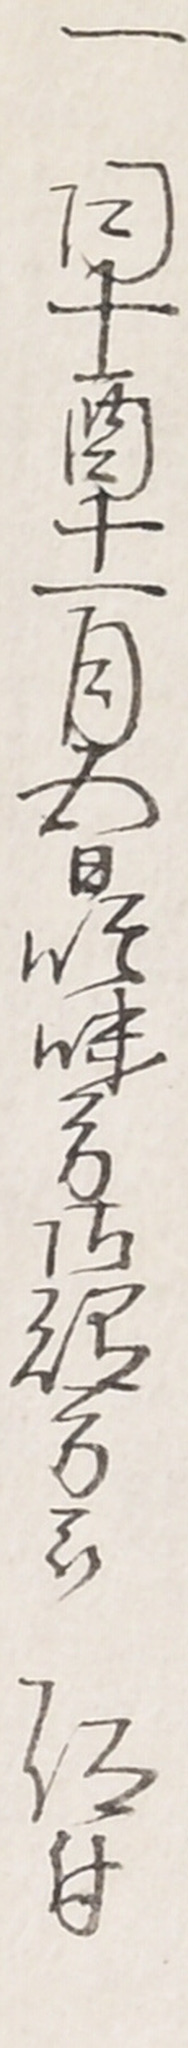一同十酉十一月五日吟味方御賄方被仰付
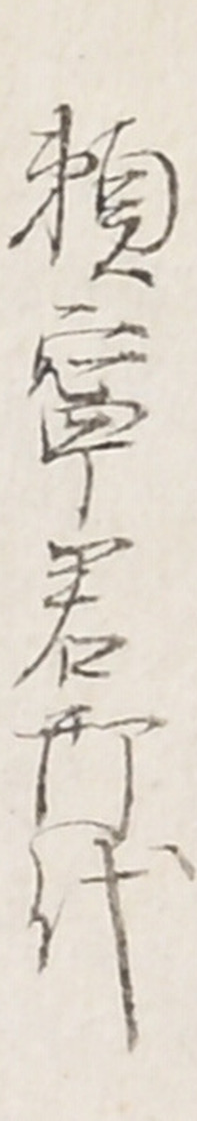頼寧君御代
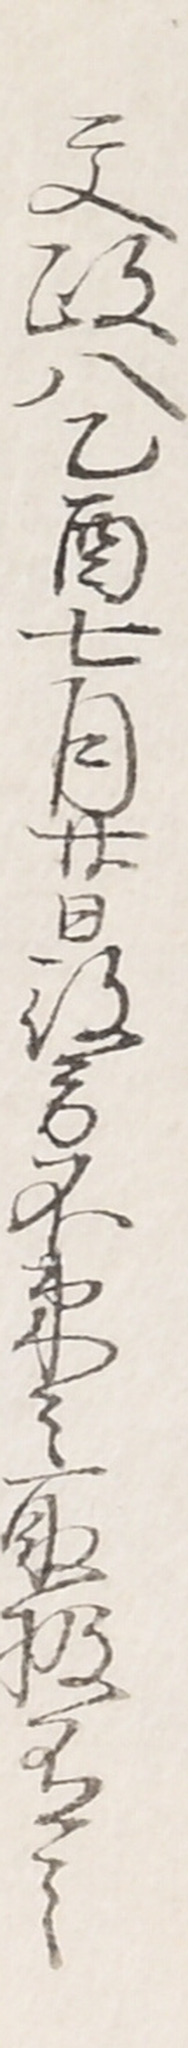一文政八乙酉七月廿日役方不束之取扱有之
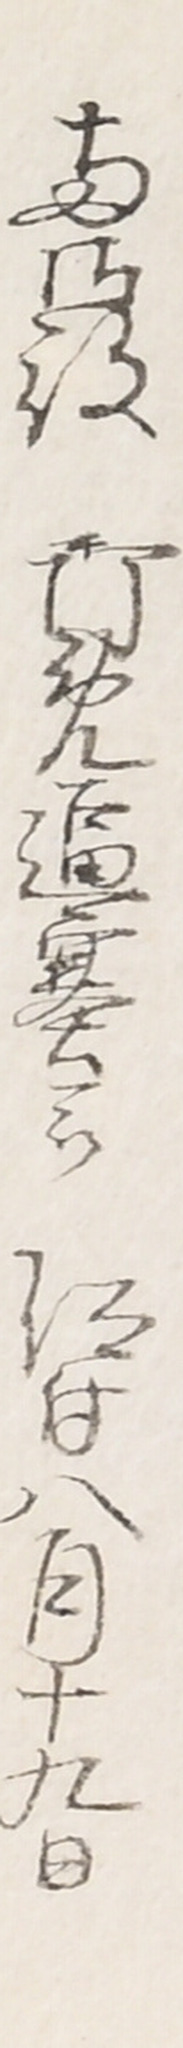両御役御免逼塞被仰付八月十九日
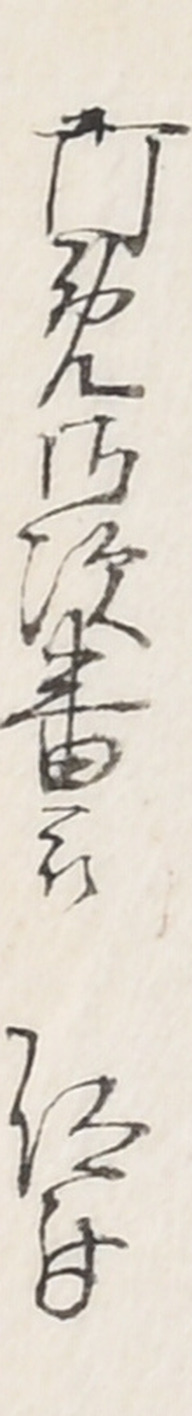御免御次番被仰付
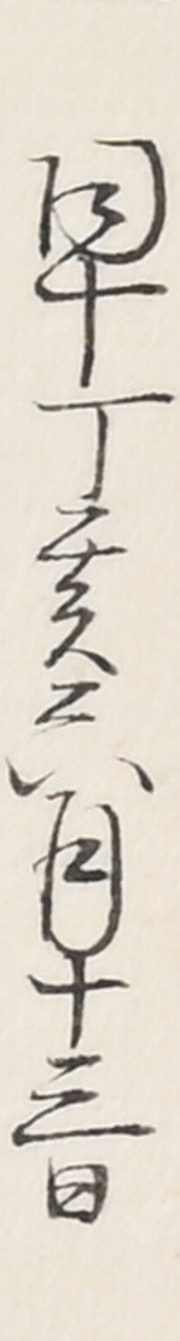一同十丁亥六月十三日
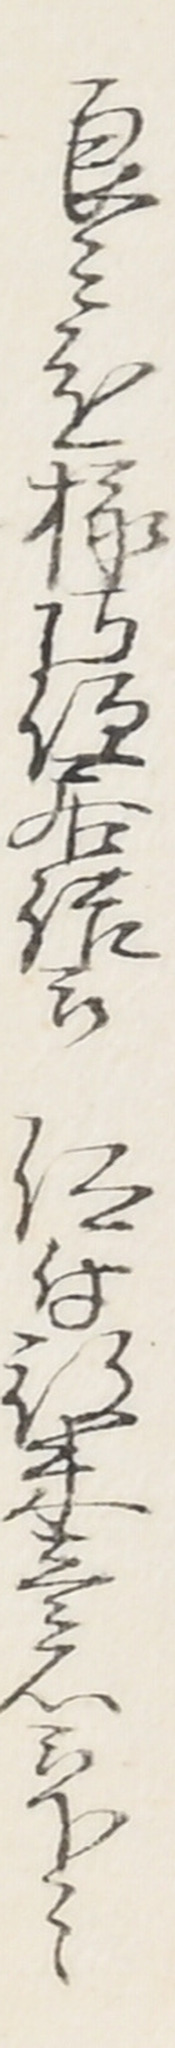良之進様御住居詰被仰付役米壱石被下之
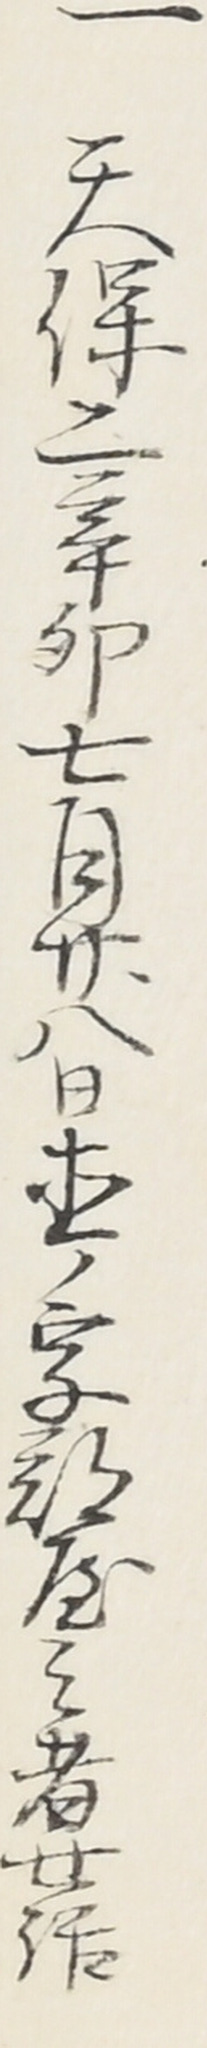一天保二辛卯七月廿八日直ノ字部屋之者世話
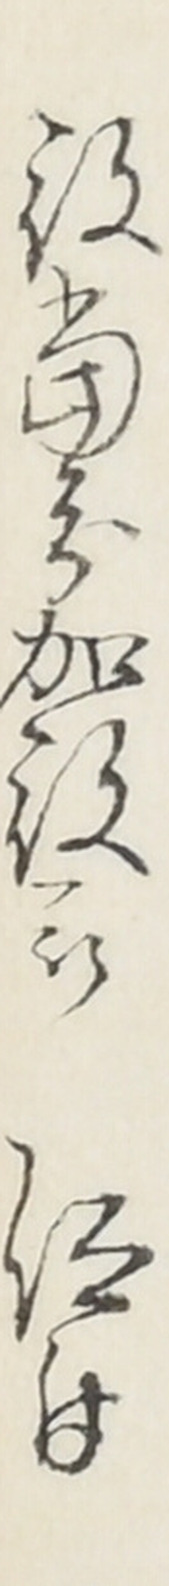役当分加役被仰付
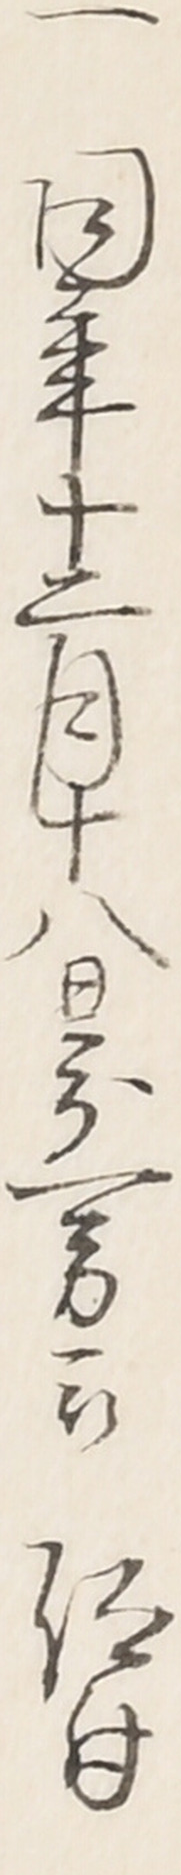一同年十二月十八日分一方被仰付
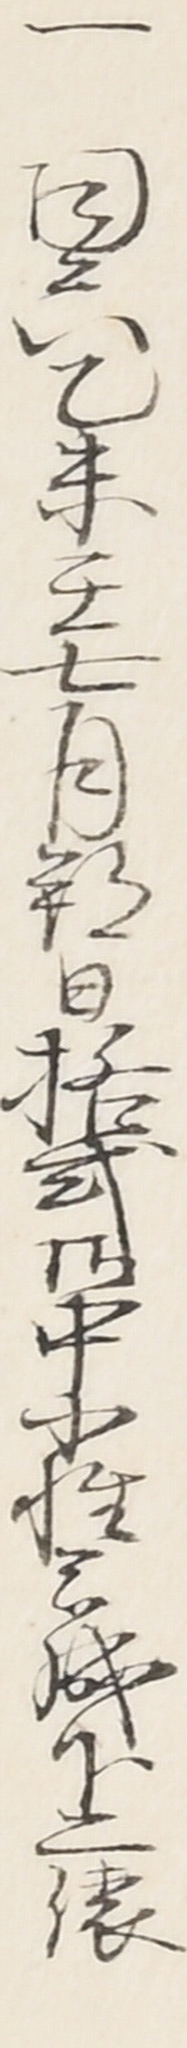一同六乙未閏七月朔日格式御中小性被成下二俵
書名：無足諸士勤仕録（四）
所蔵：伊那市立高遠町図書館・合同会社AMANE
